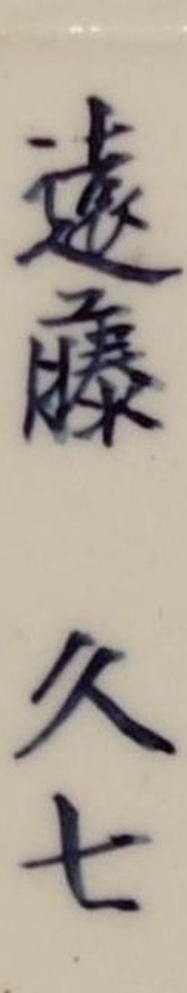遠藤久七
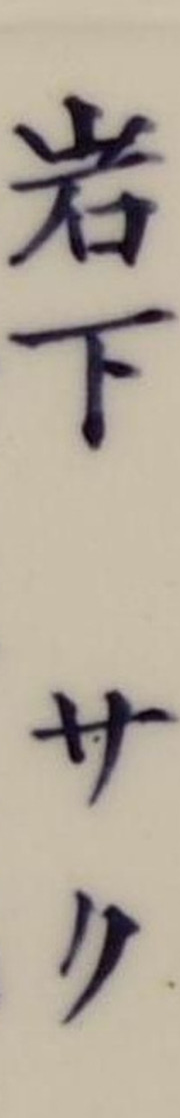岩下サク
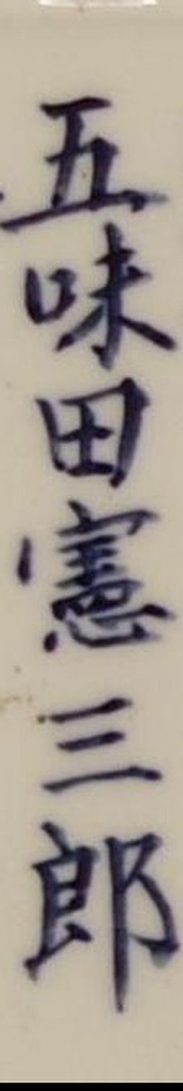五味田憲三郎
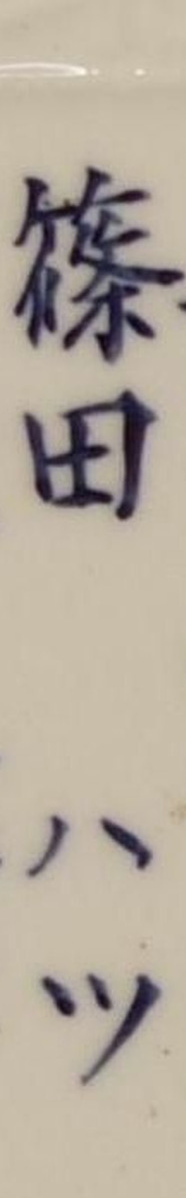篠田ハツ
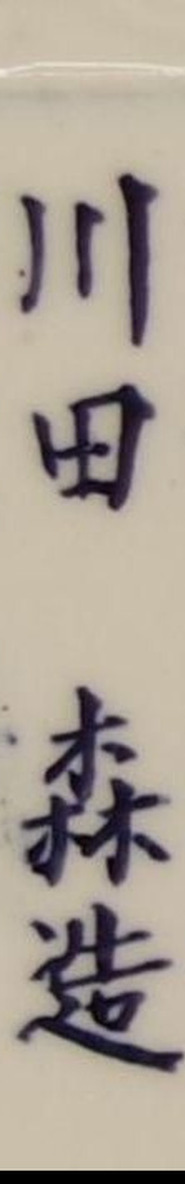川田森造
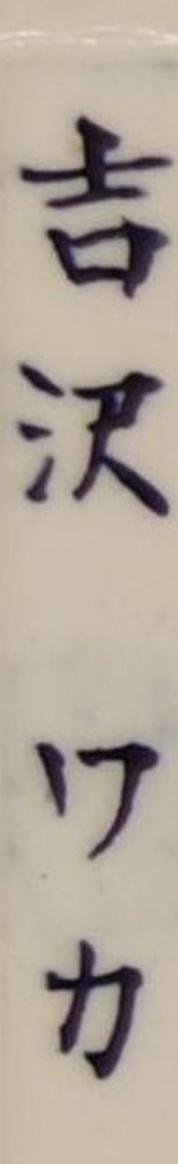吉沢ワカ

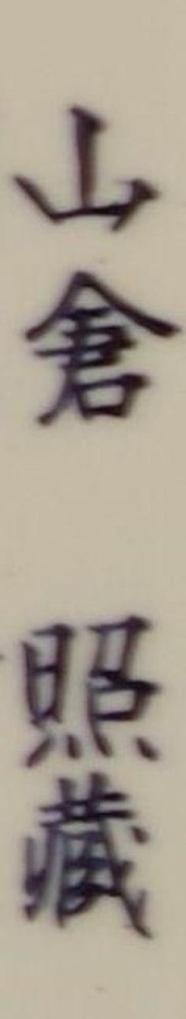山倉照蔵
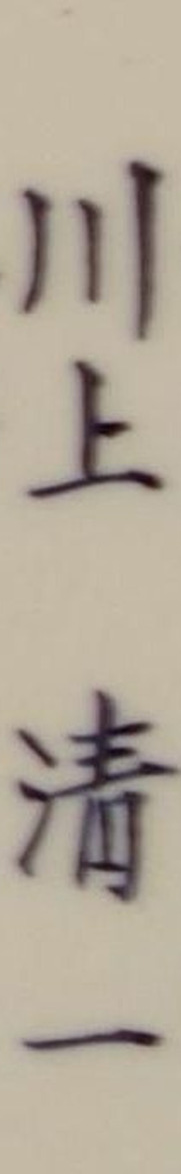川上清一
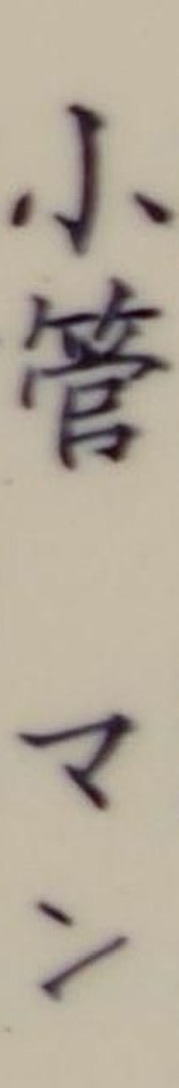小管マン
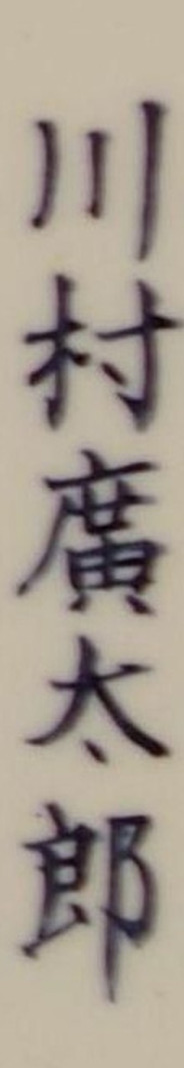川村広太郎
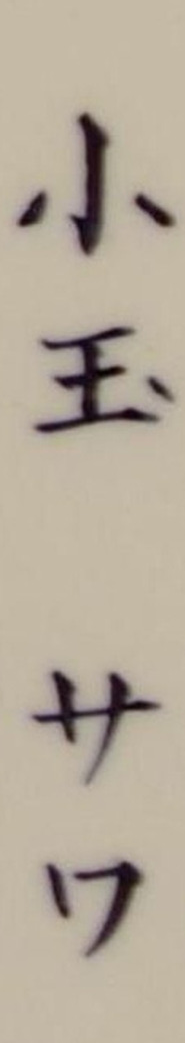小玉サワ
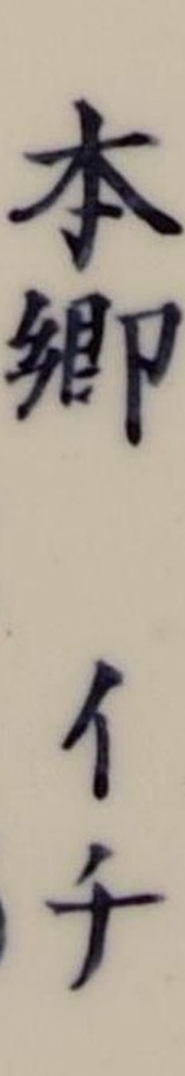本郷イチ
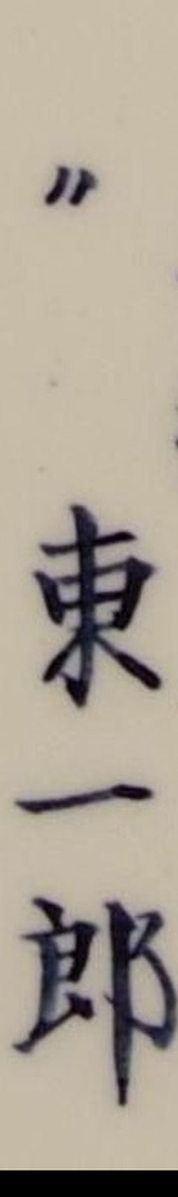東一郎
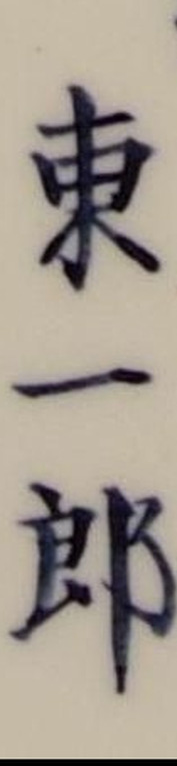東一郎
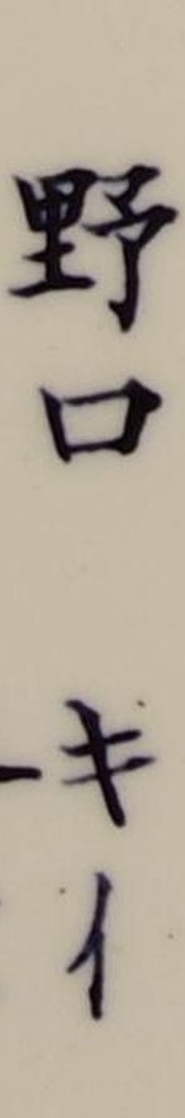野口キイ
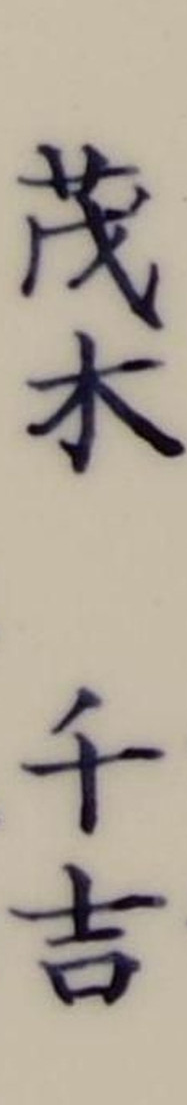茂木千吉
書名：M~S
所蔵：高野山金剛峯寺
